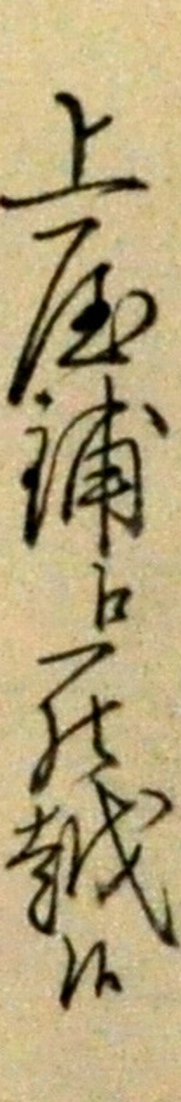上屋舗え罷越候
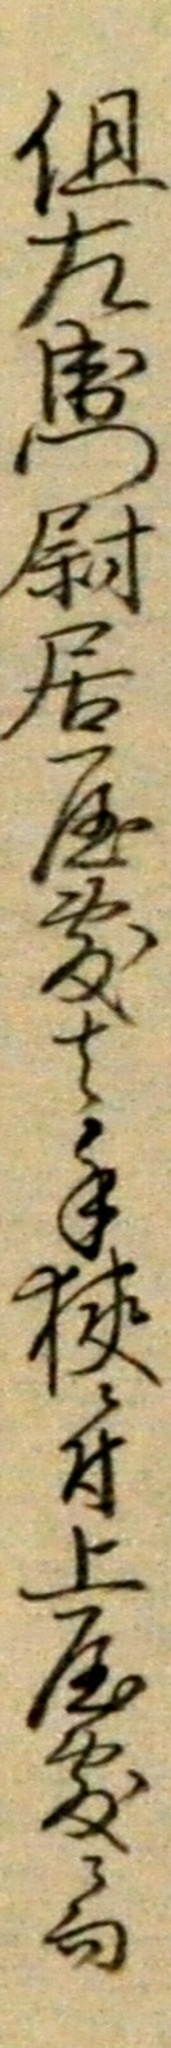但左衛門尉居屋敷は手狭ニ付上屋敷ニ向
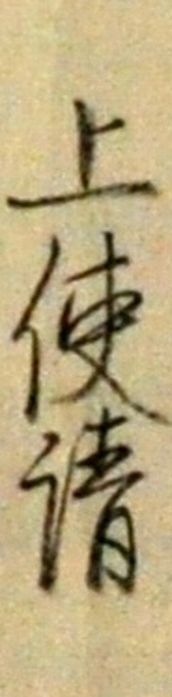上使請
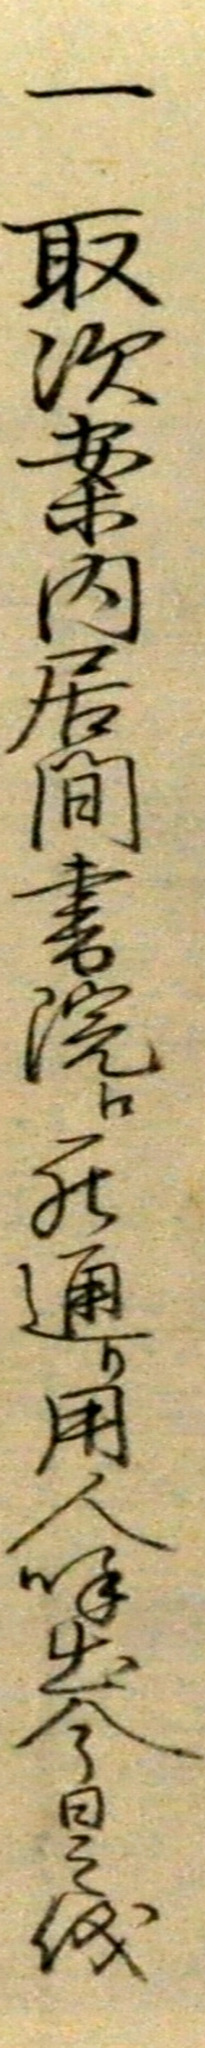一取次案内居間書院え罷通り用人呼出今日之儀
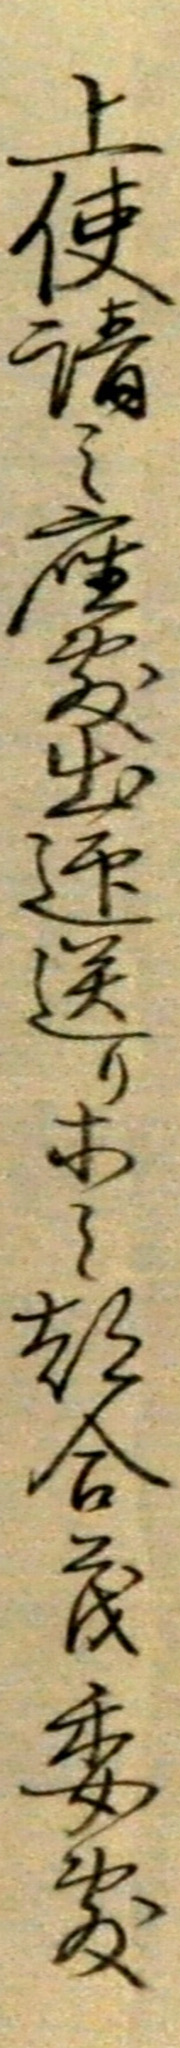上使請之座敷出迎送り等之都合も委敷
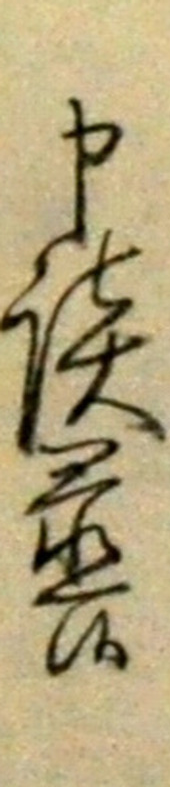申談置候

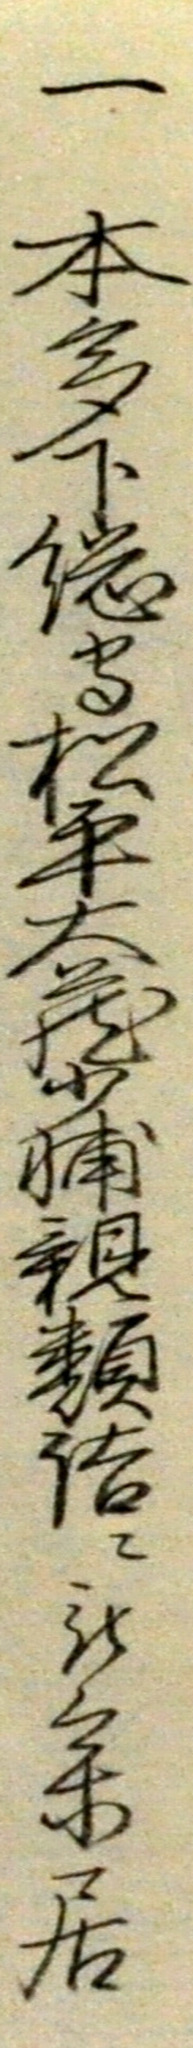一本多下総守松平大蔵少輔親類詰ニ被参居
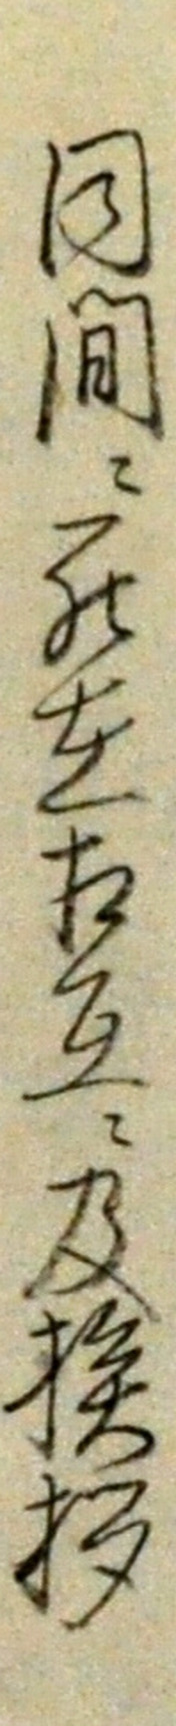同間ニ罷在相互ニ及挨拶
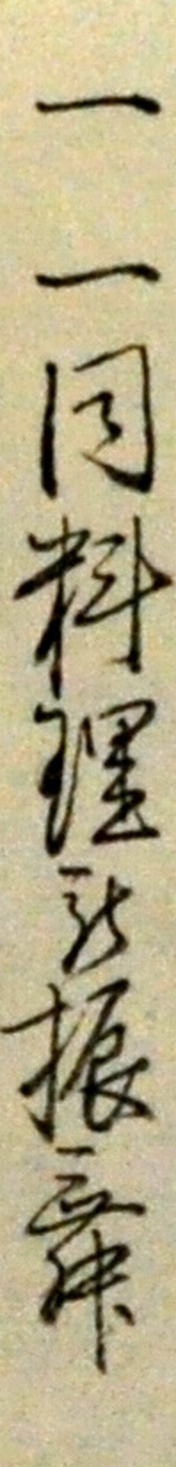一一同料理被振舞
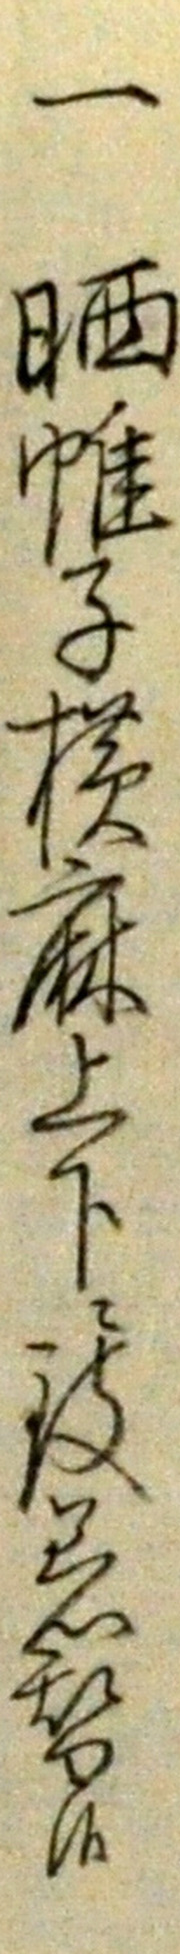一晒帷子横麻上下ニ致着替候
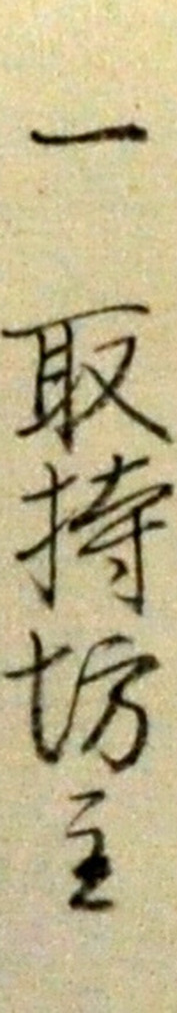一取持坊主
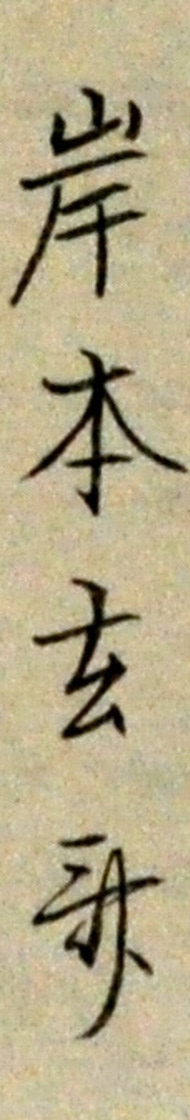岸本玄斎
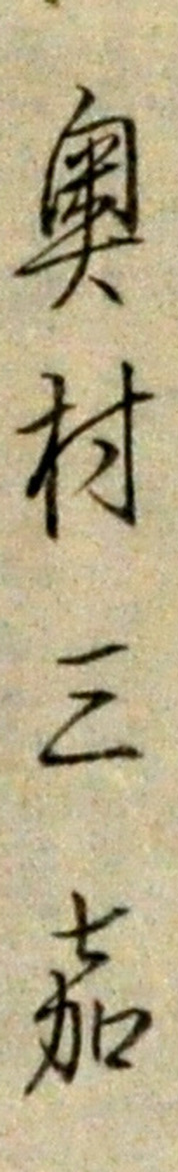奥村三嘉
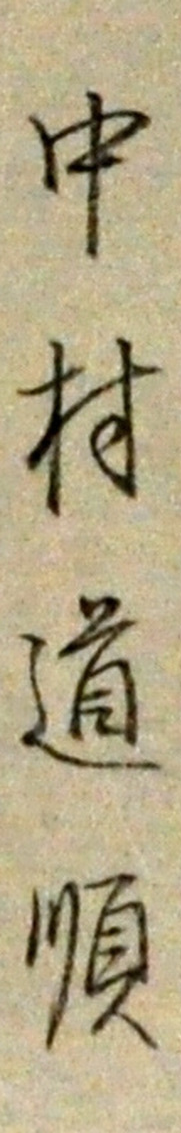中村道順
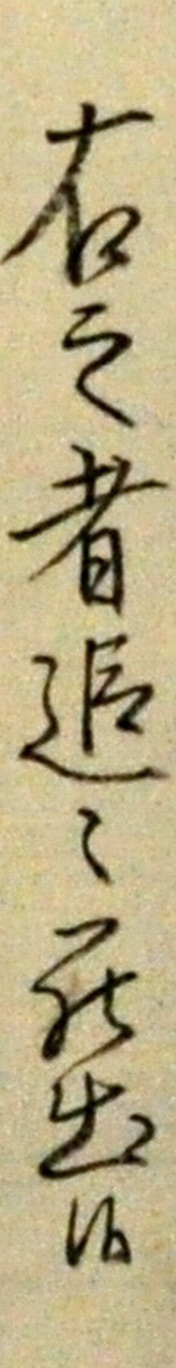右之者追々罷出候
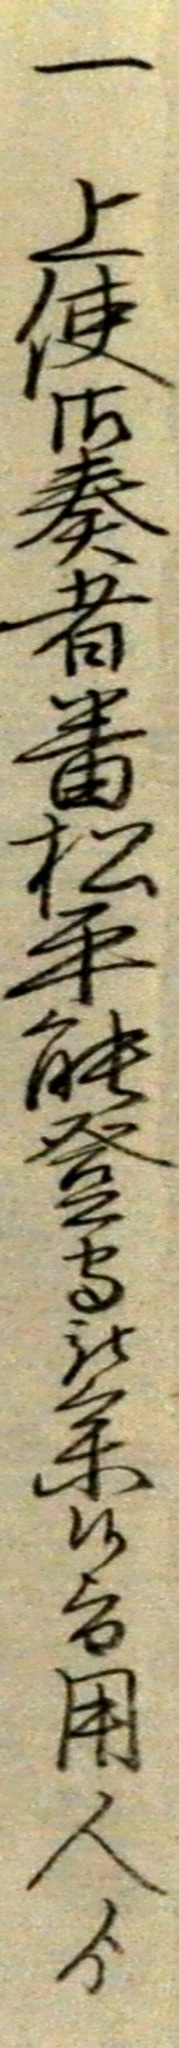一上使御奏者番松平能登守被参候旨用人ゟ
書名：上使仰付ラレ候節ノ留外
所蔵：伊那市立高遠町図書館・合同会社AMANE
